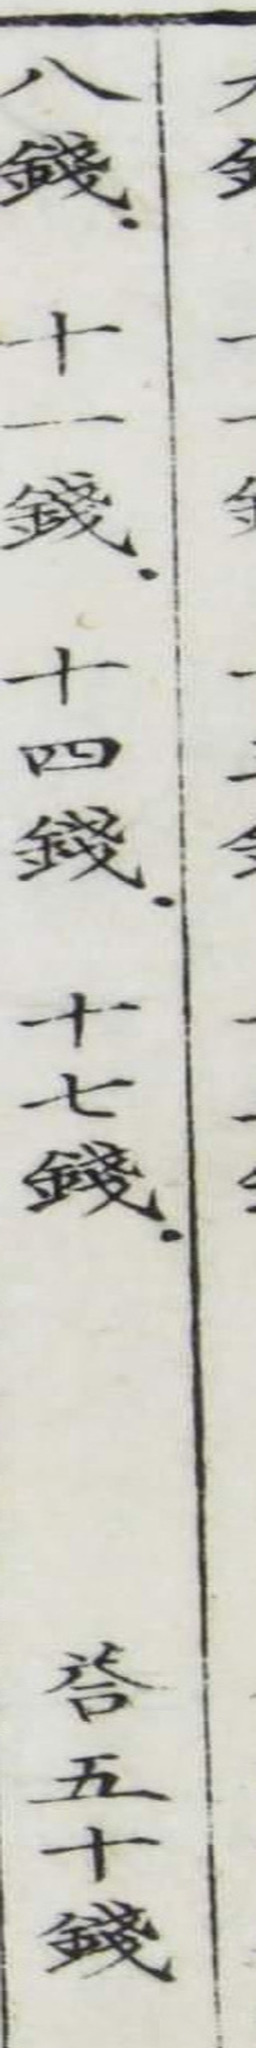八銭、十一銭、十四銭、十七銭、答五十銭
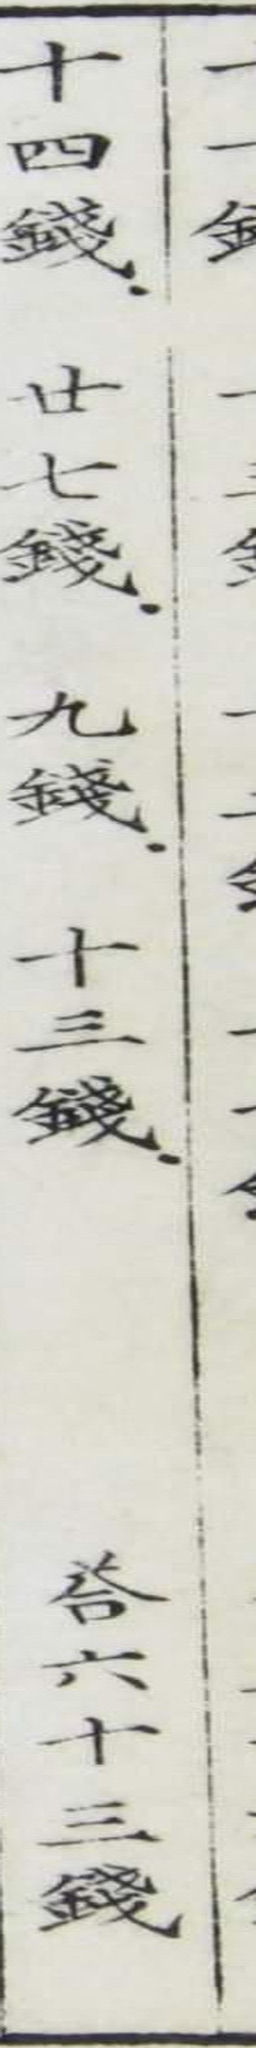十四銭、廿七銭、九銭、十三銭、答六十三銭
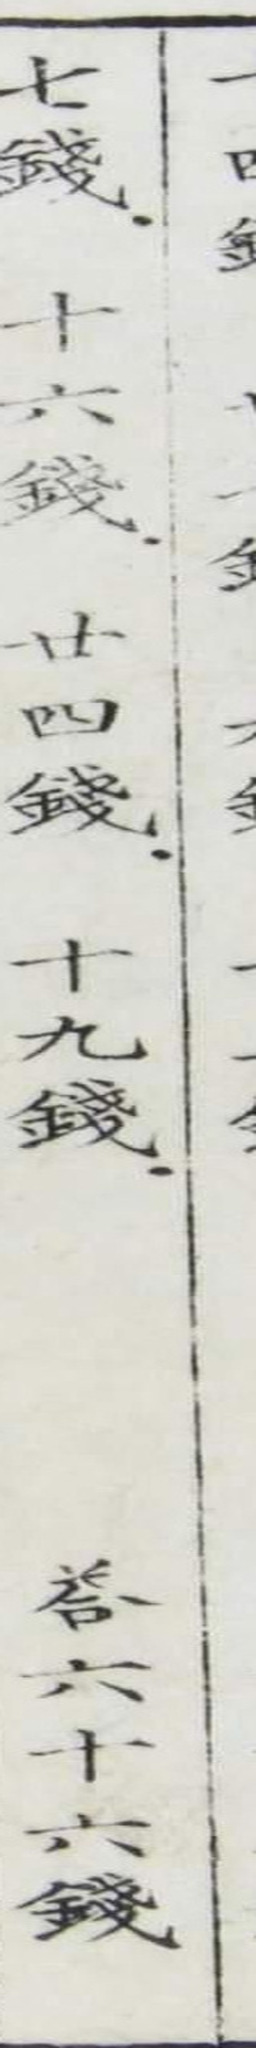七銭、十六銭、廿四銭、十九銭、答六十六銭
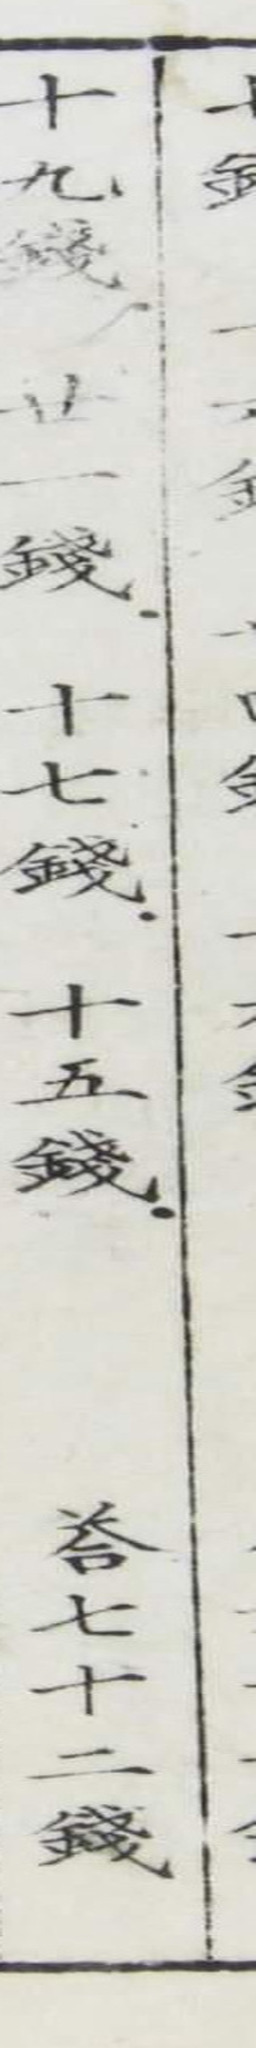十九銭、廿一銭、十七銭、十五銭、答七十二銭
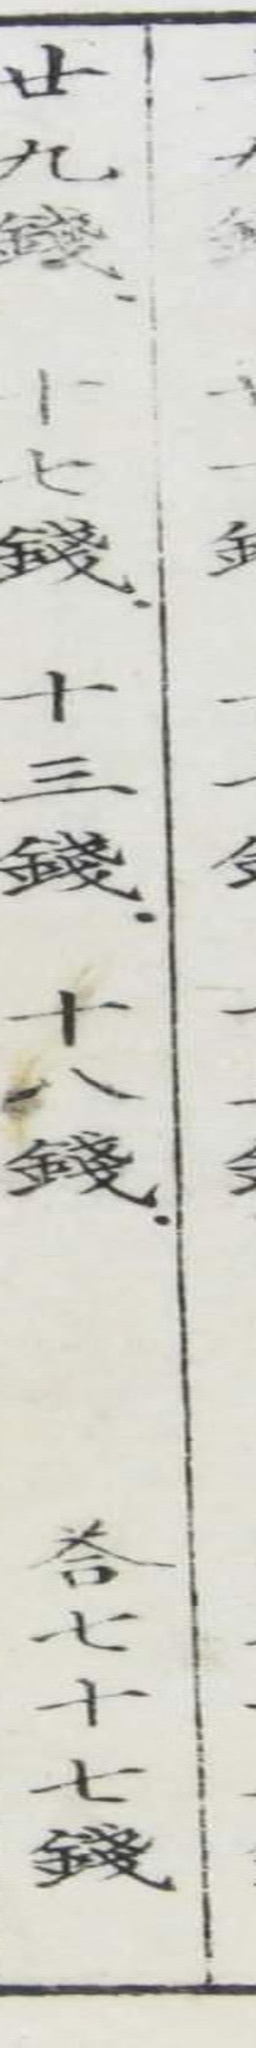廿九銭、十七銭、十三銭、十八銭、答七十七銭
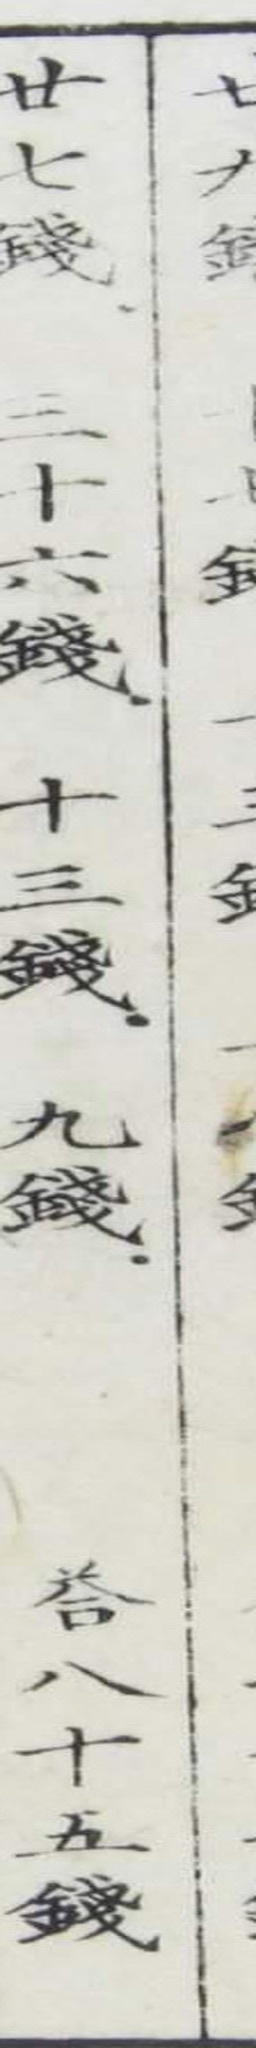廿七銭、三十六銭、十三銭、九銭、答八十五銭
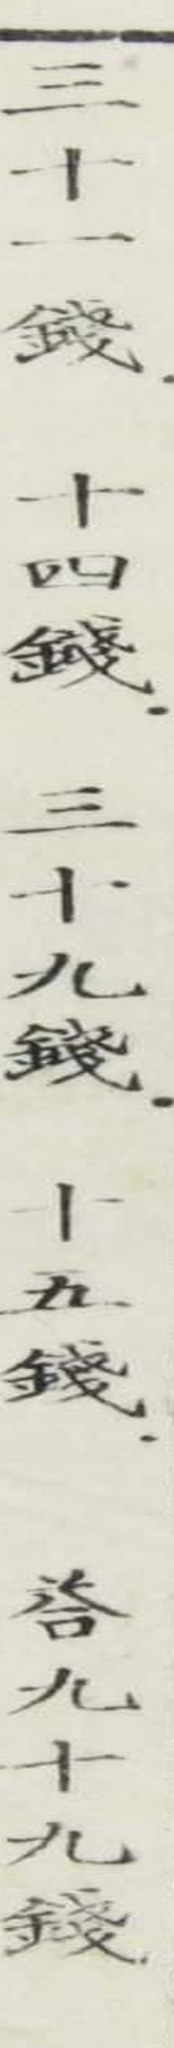三十一銭、十四銭、三十九銭、十五銭、答九十九銭
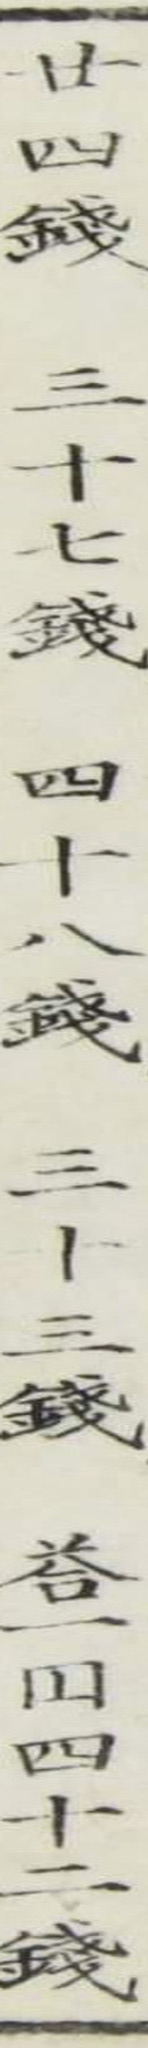廿四銭、三十七銭、四十八銭、三十三銭、答一円四十二銭
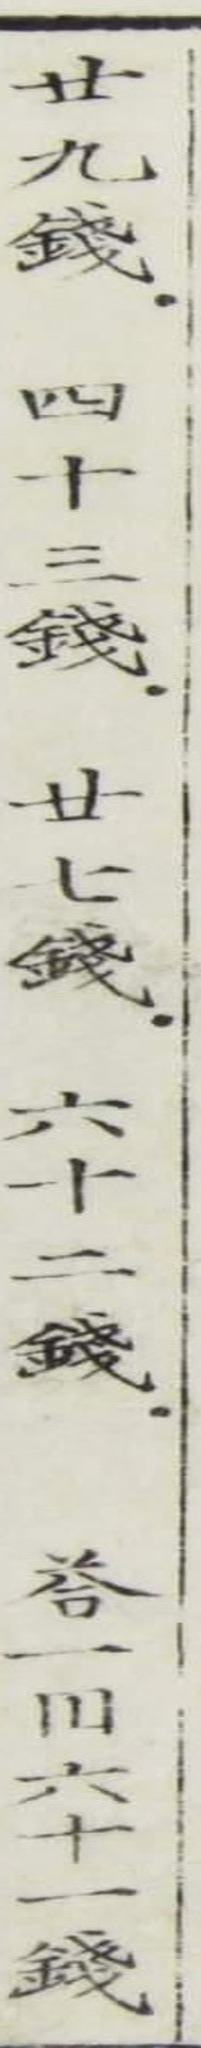廿九銭、四十三銭、廿七銭、六十二銭、答一円六十一銭
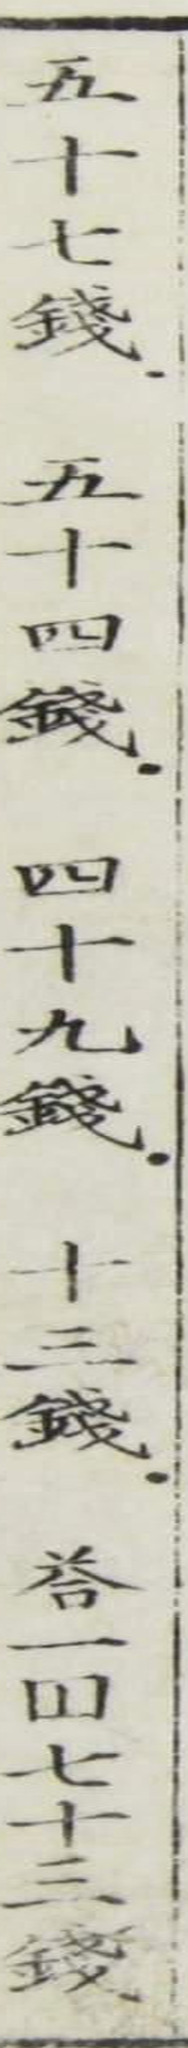五十七銭、五十四銭、四十九銭、十三銭、答一円七十三銭

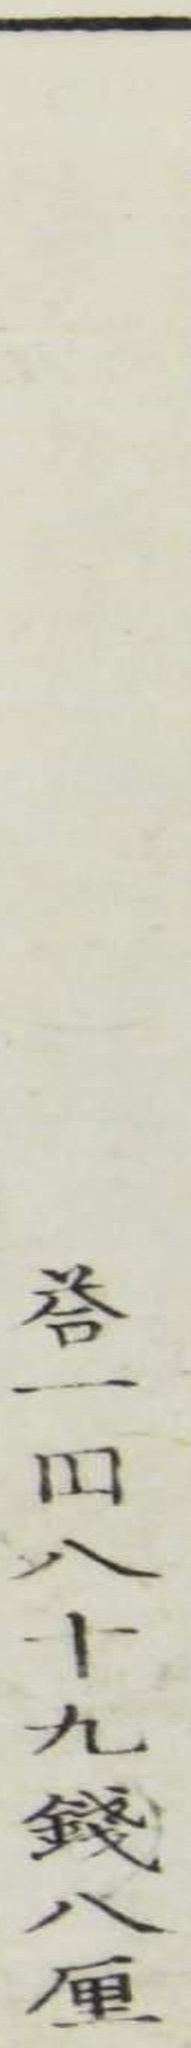答一円八十九銭八厘
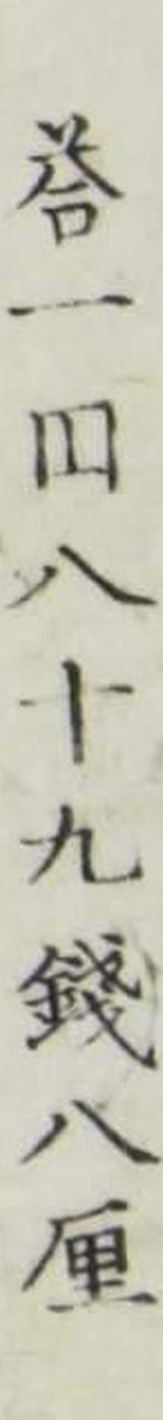答一円八十九銭八厘
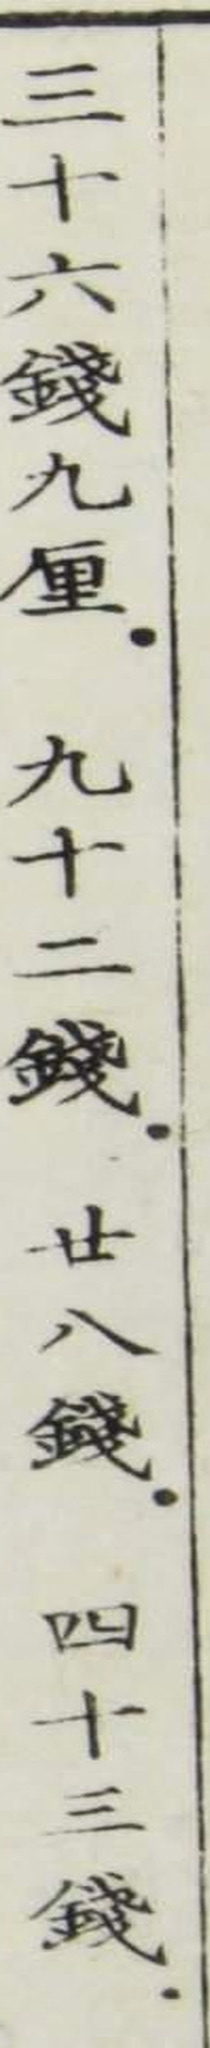三十六銭九厘、九十二銭、廿八銭、四十三銭、
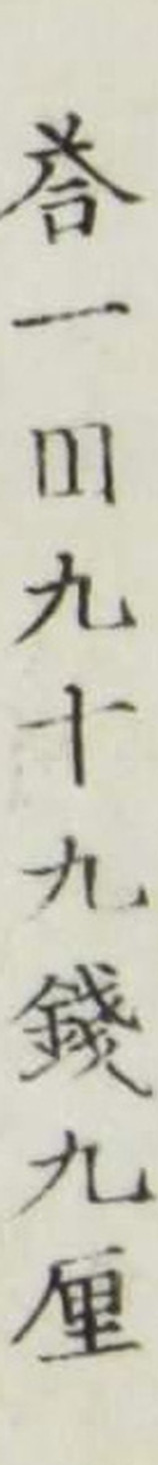答一円九十九銭九厘
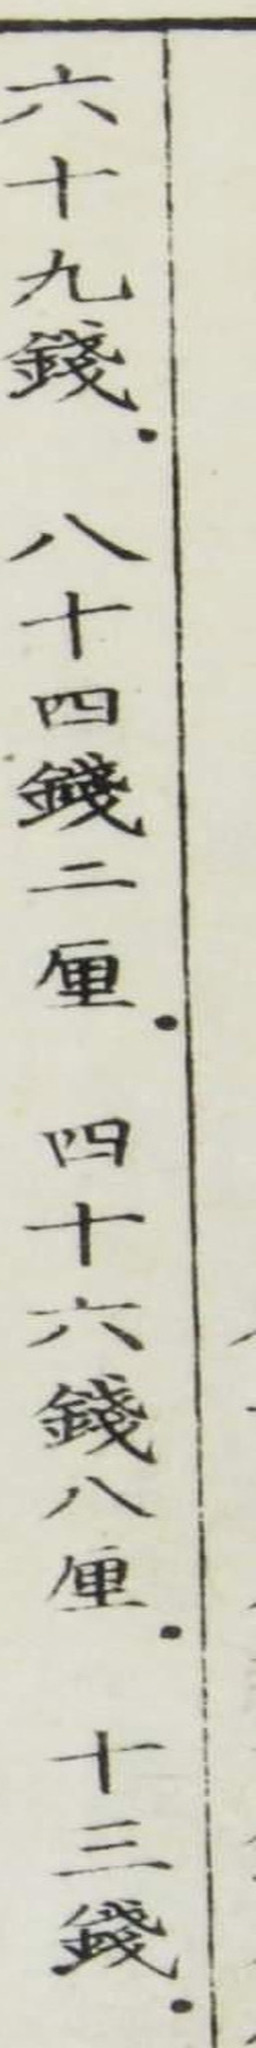六十九銭、八十四銭二厘、四十六銭八厘、十三銭、
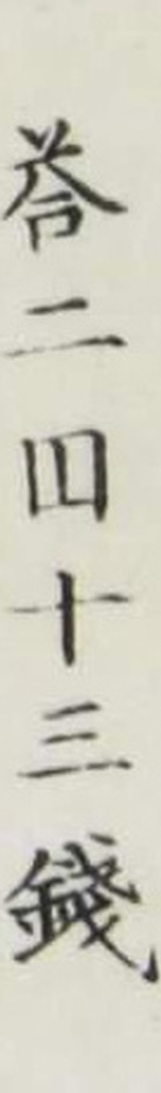答二円十三銭
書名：明治小學塵劫記 卷1
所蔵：東京学芸大学教育コンテンツアーカイブ
